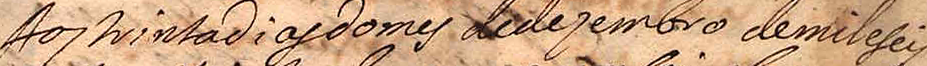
Aos trinta dias do mes de dezembro de mil e seis
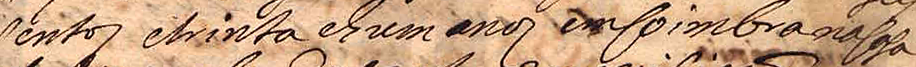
Centos e trinta e hum anos em Coimbra na Casa
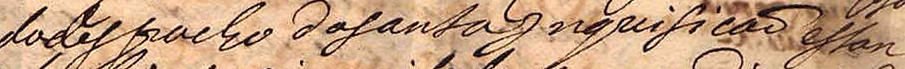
do despacho da santa Jnquisicaõ estan
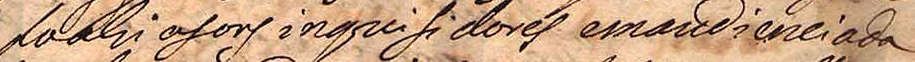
do ahi o sors inquisidores em audiencia da
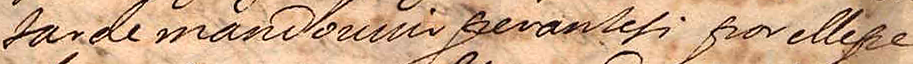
tarde mandou uir perante si por elle pe
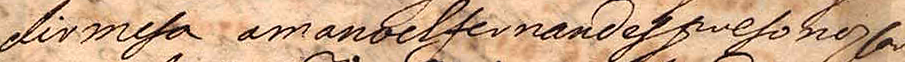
dir mesa a manoel fernandes preso nos Car
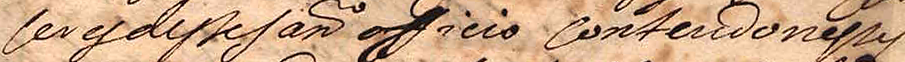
Ceres deste santo officio Conteudo nestes
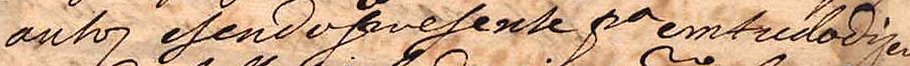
autos e sendo presente pa em tudo dizer
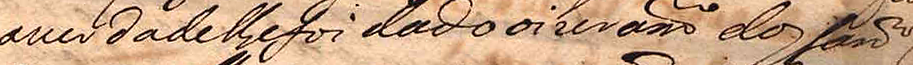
a uerdade lhe foi dado o iuramto dos santos
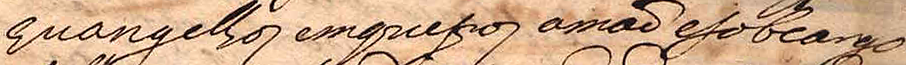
Euangelhos em que pos a mão e sob cargo
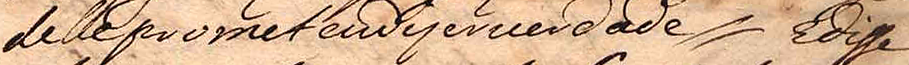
delle prometeu dizer uerdade E disse
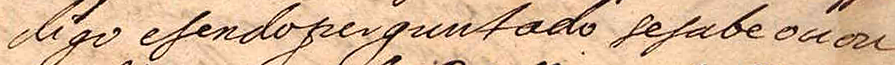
digo e sendo perguntado se sabe ou ou
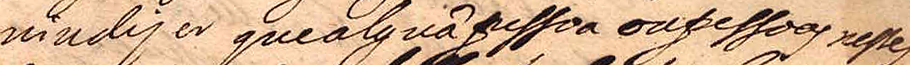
uiu dizer que alguā pessoa ou pessoas nestes
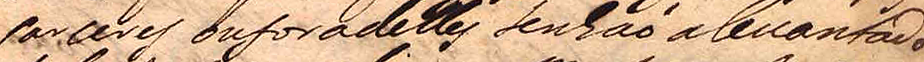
Carceres ou fora delles tenhaõ aleuantado
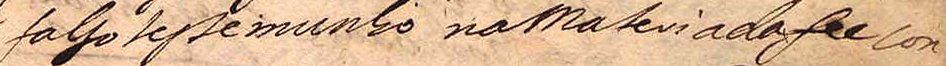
falso testemunho na Materia da fee con
